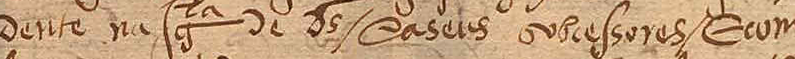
dente na Jgra de ds̄ / e a seus sobcessores / E com
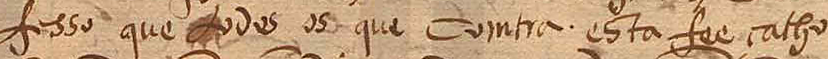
fesso que todos os que Comtra esta fee catho
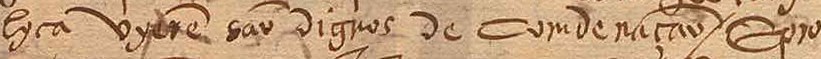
lyca vyerē são dignos de Comdenação / E pro
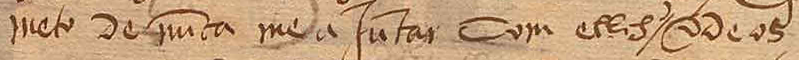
meto de nūca me aJūtar Com elles / e de os
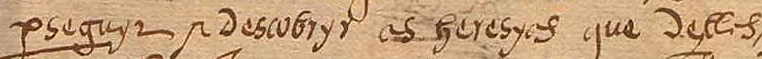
ꝑseguyr e descobryr as heresyas que delles /
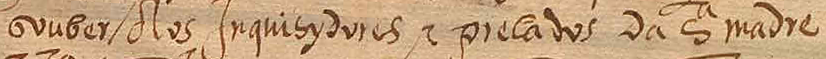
souber / Aos Jnquisydores e prelados da Sta madre
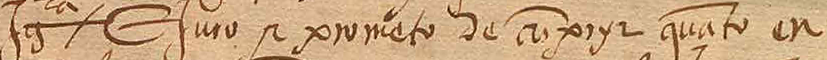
Jgra / E Juro e prometo de c̄upryr q̄uato en
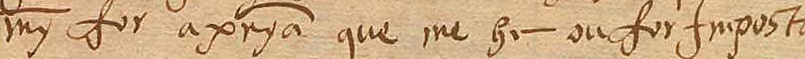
m̄y for a pn̄ya que me he ou for Jmposta
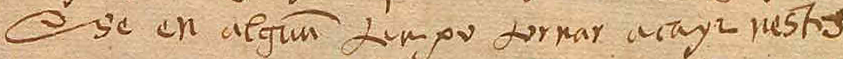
e se en alguū tempo tornar a cayr nestes
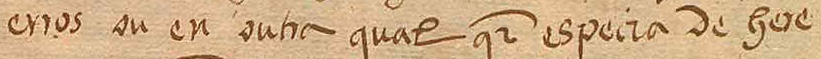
erros ou en outra quaLq̄r especia de here
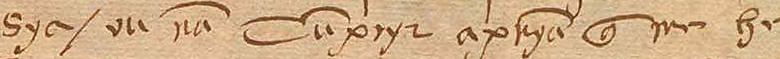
sya / ou n̄a Cūpryr a pn̄ya q̄ me he
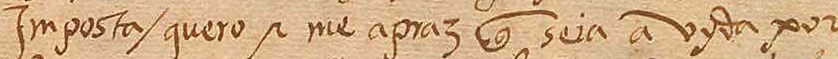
Jmposta / quero e me apraz q̄ seia avyda por
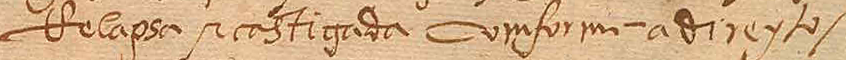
Relapsa e castigada Comforme a direyto /
